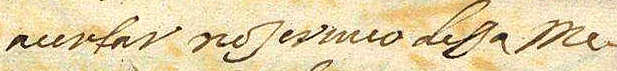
acertar no seruico dessa me
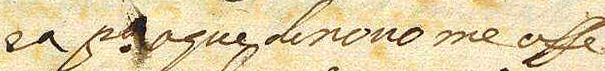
za p.a o que de nouo me offe
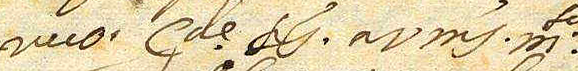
reco. Gde. Ds̄. a v ms̄. mtos.
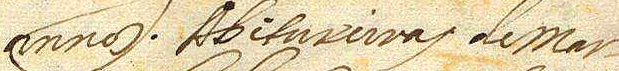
annos. Abitureiras de mar
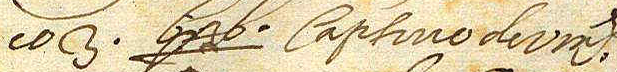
co 3. 646. Captiuo de v ms̄.
